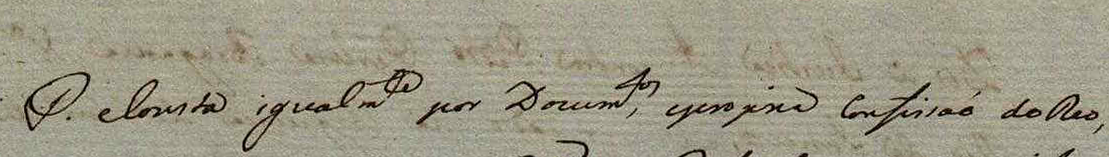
P. e Consta igualmte por Documtos, e propria Confissaõ do Reo,
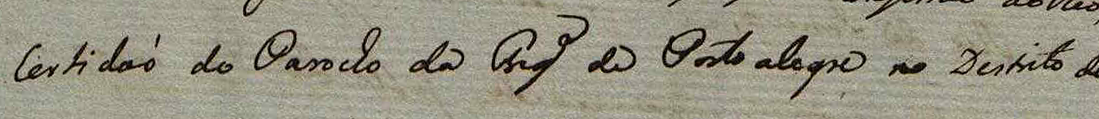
Certidaõ do Parocho da Frega de Porto alegre no Destrito do
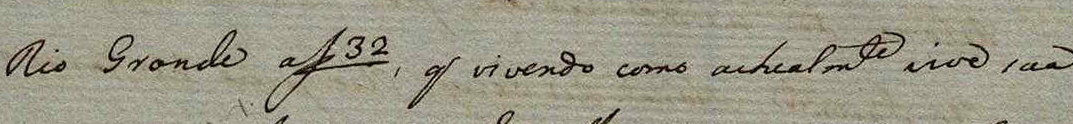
Rio Grande a f. 32, q̄ vivendo como actualmte vive sua
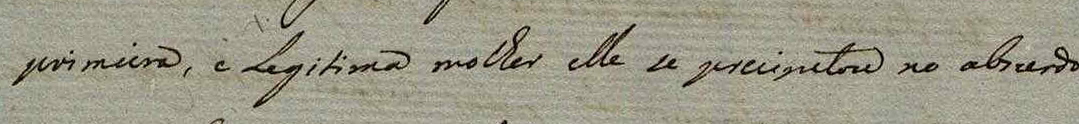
primeira, e Legitima molher elle se precipetou no absurdo
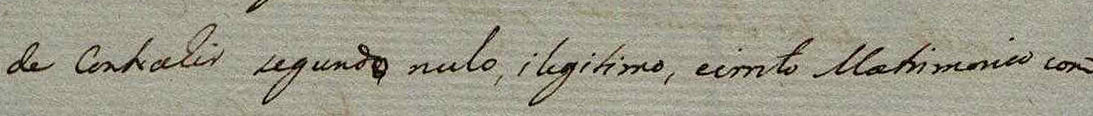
de Contrahir segundo nulo, ilegitimo, e irreto Matrimonio com
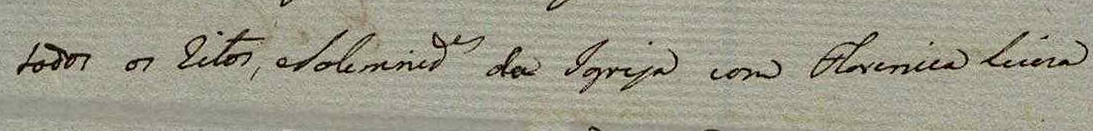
todos os Ritos, e Solemnides da Igreja com Florencia Luiza
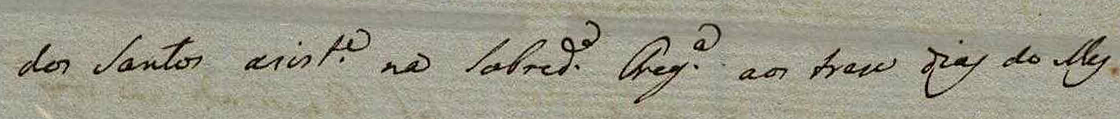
dos Santos asist.e na sobred.a Freg.a aos treze dias do Mes
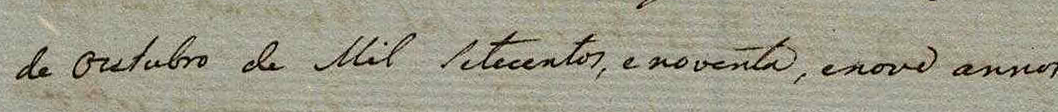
de Outubro de Mil Setecentos, e noventa, e nove annos
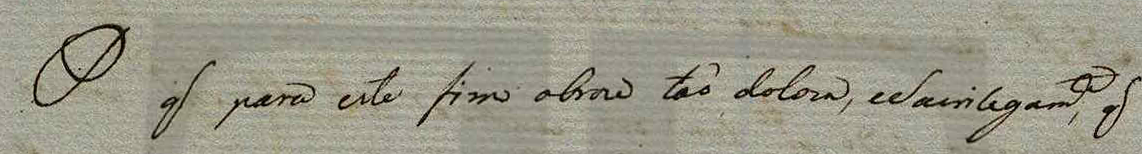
P q̄ para este fim obrou taõ doloza, e Sacrilegamte, q̄
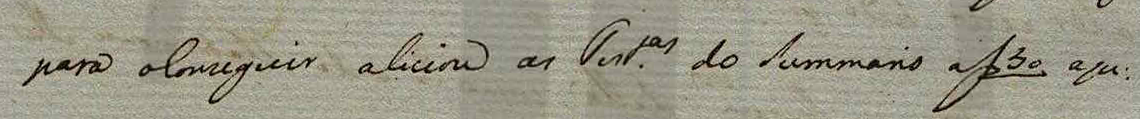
para o Conseguir aliciou as Test.as do Summario a f. 30 a ju
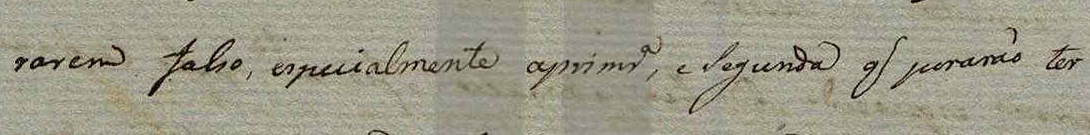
rarem falso, especialmente a primra, e Segunda q̄ juraraõ ter
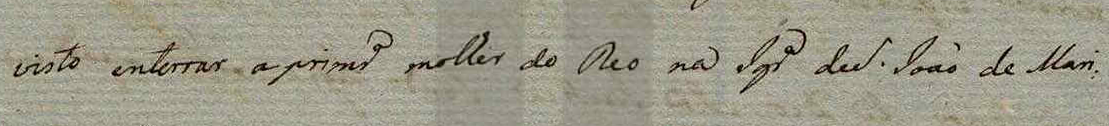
visto enterrar a primra molher do Reo na Igra de S. Ioaõ de Mari
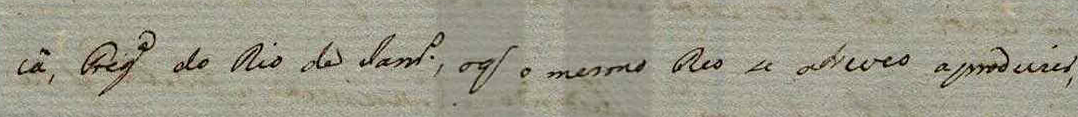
cá, Frega do Rio de Ianr.o, o q̄ o mesmo Reo se atreveo a produzir,
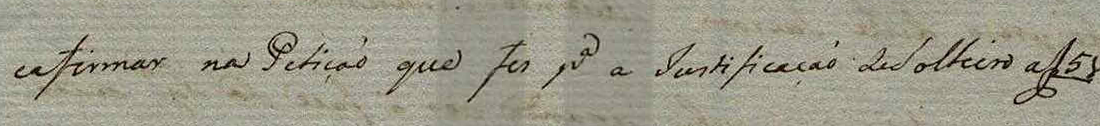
e afirmar na Petiçaõ que fes pa a Iustificaçaõ de solteiro a f. 51
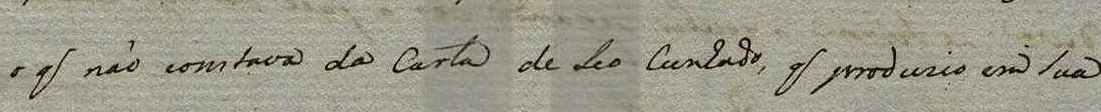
o q̄ naõ constava da Carta de Seo Cunhado, q̄ produzio essa Sua
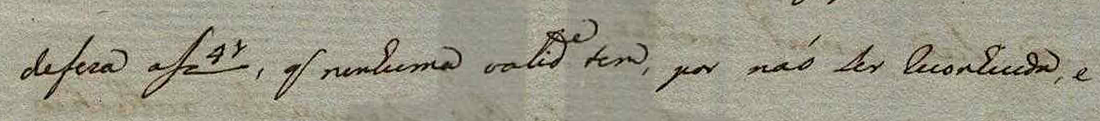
defeza a f. 41, q̄ nenhuma valide tem, por naõ ser Reconheceda, e
